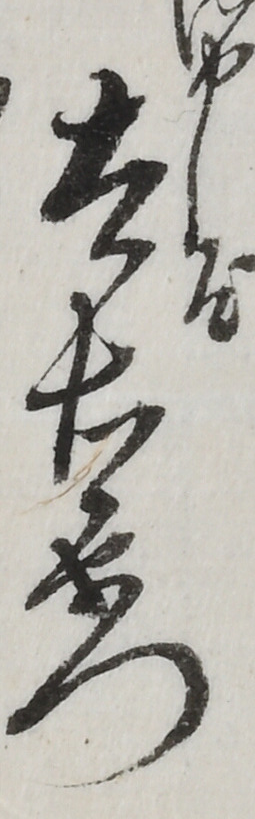太右衛門
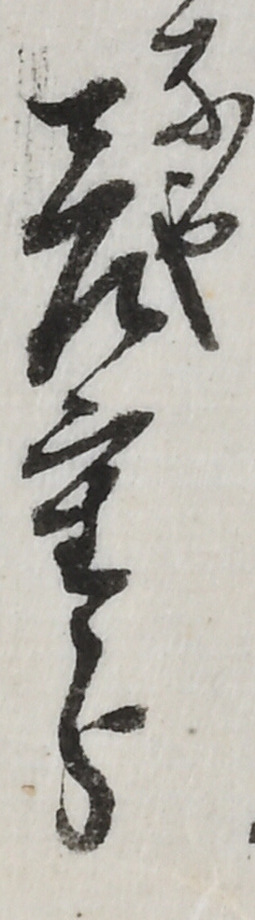彦重郎
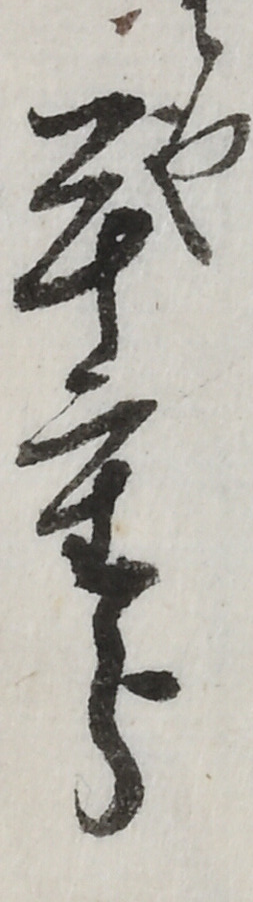平重郎
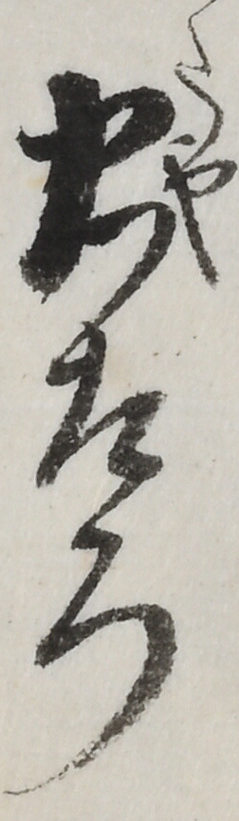忠左衛門

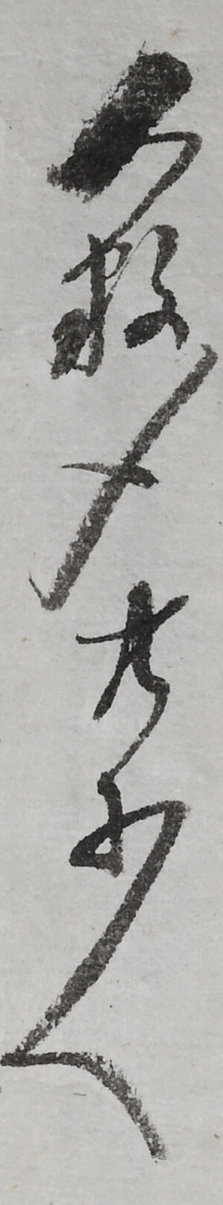人数〆廿五人
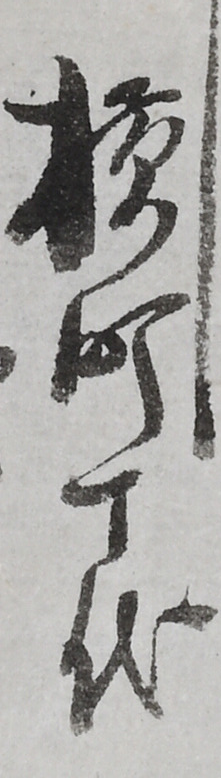横町丁代
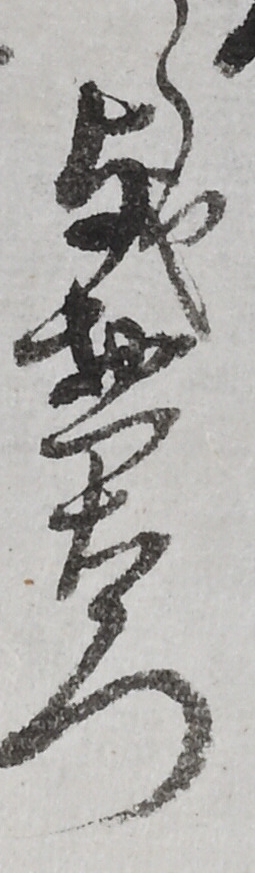与惣左衛門
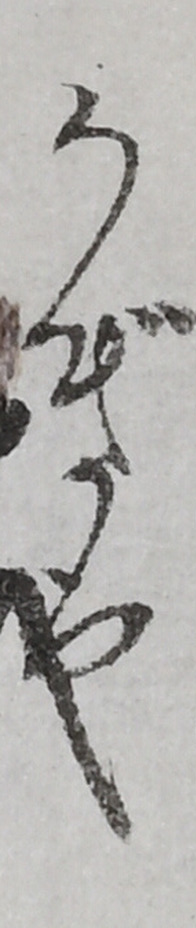かぎや
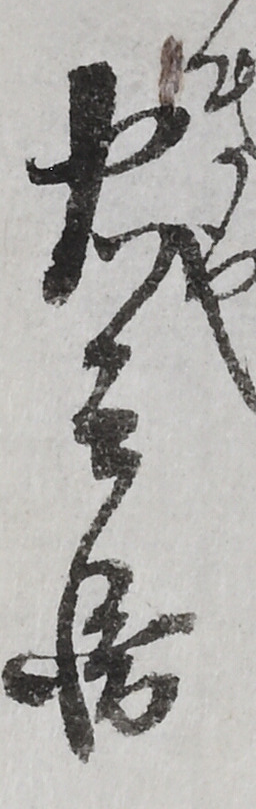忠兵衛
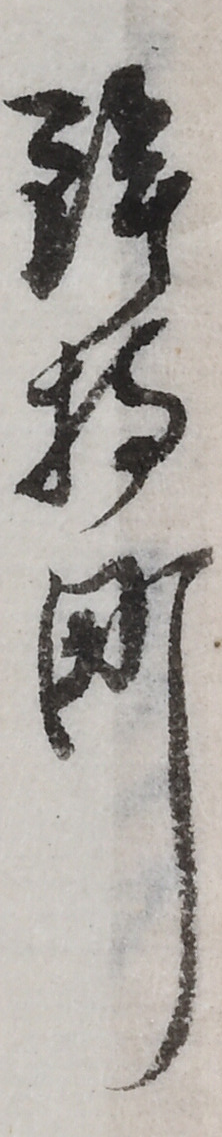鉾持町
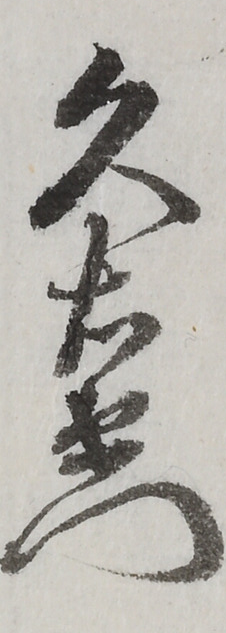平右衛門
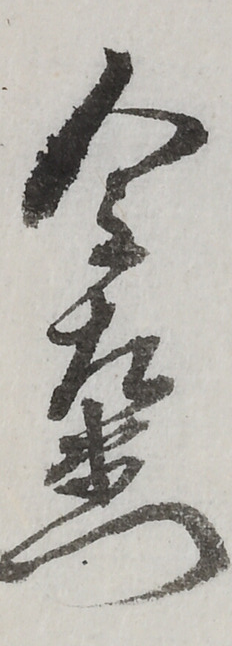金左衛門
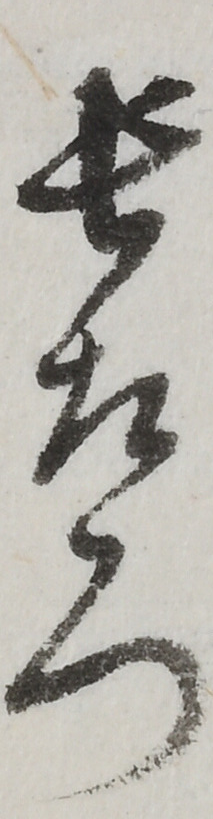金左衛門
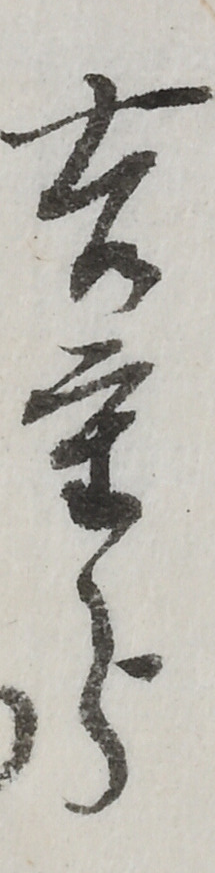吉重郎
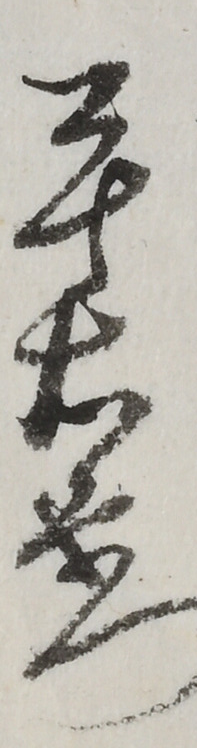平右衛門
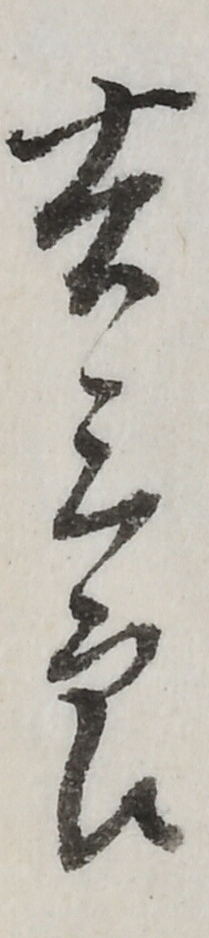吉三郎
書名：當町火消道具幷役附帳
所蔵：伊那市立高遠町図書館・合同会社AMANE
